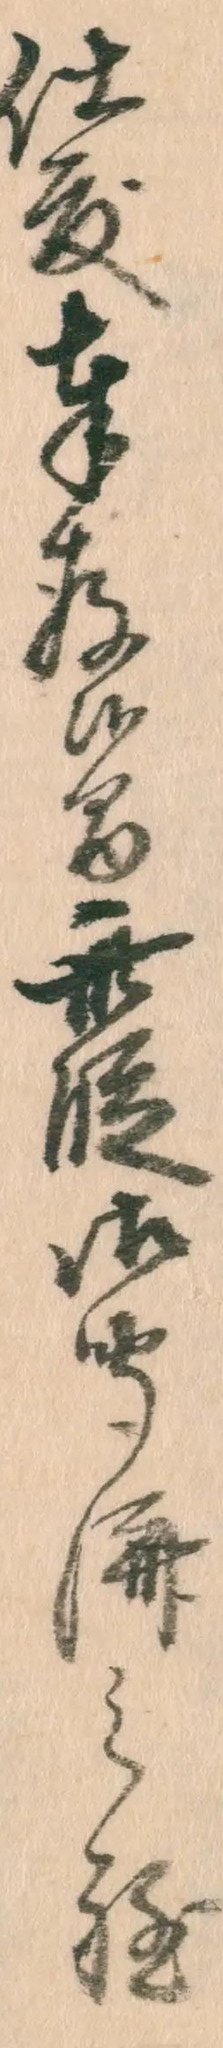仕度奉存候間此段御聞済之程
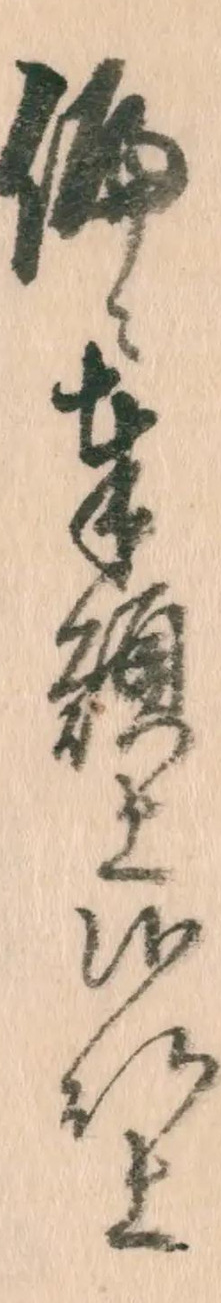偏に奉願上候以上
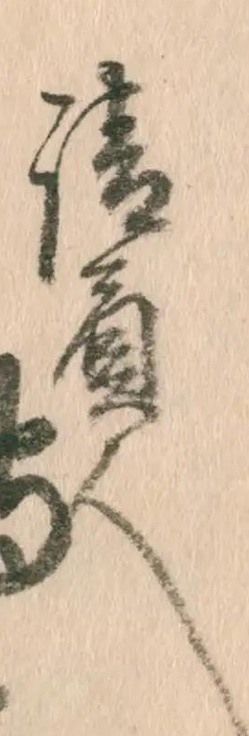請負人
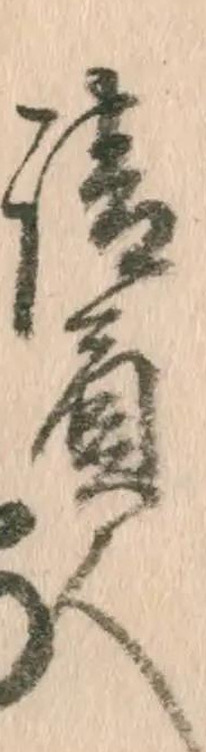請負人
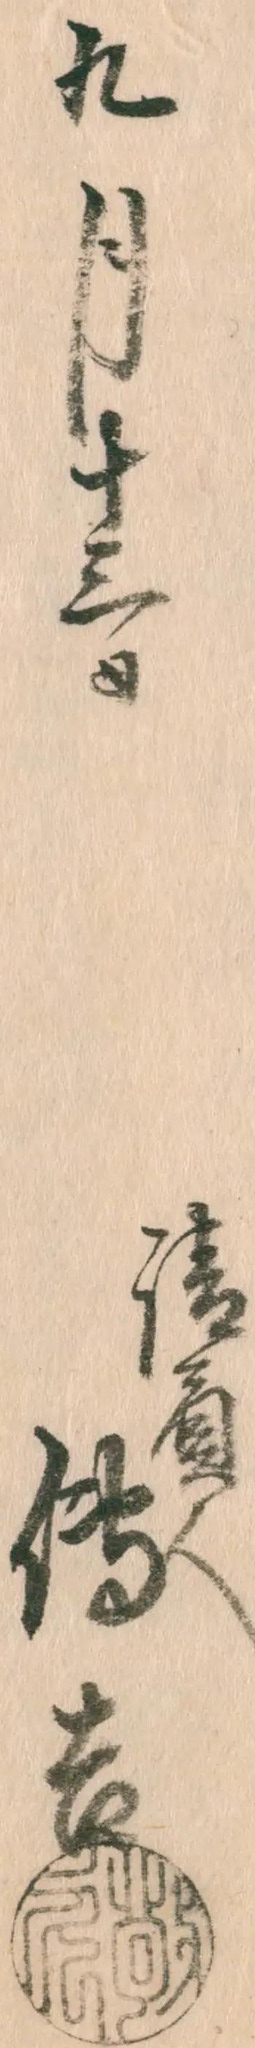九月十三日伝吉印
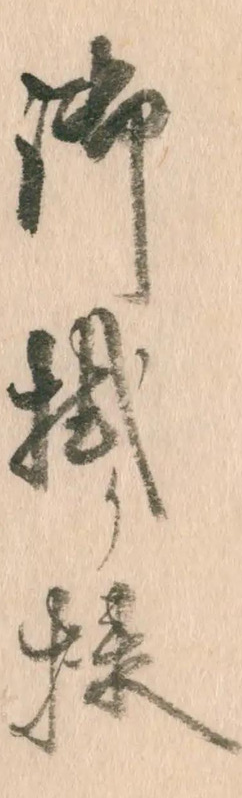御掛り様

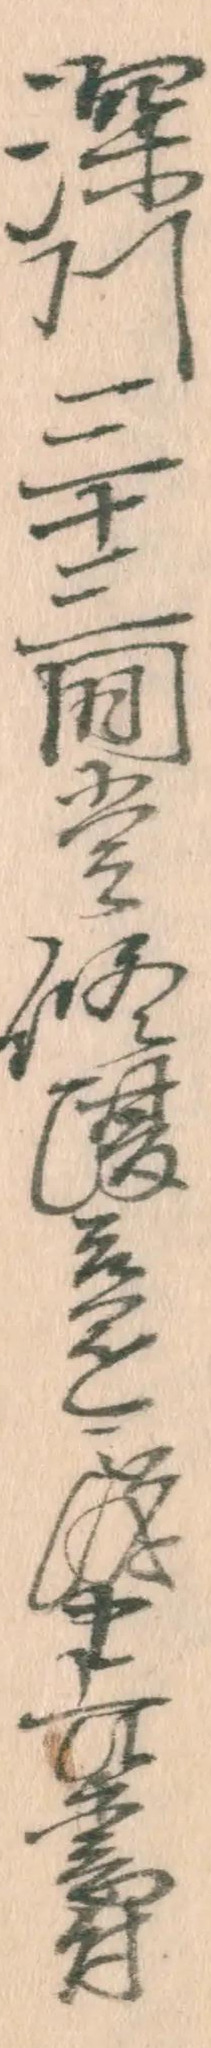│深川三十三間堂修復取懸之儀申上候書付
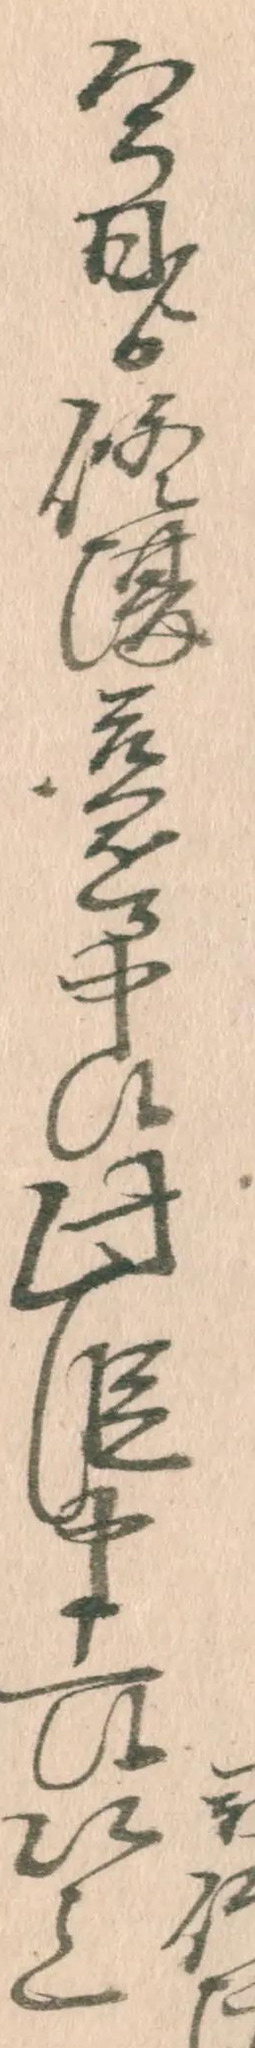今日ゟ修復取懸申候此段申上候以上
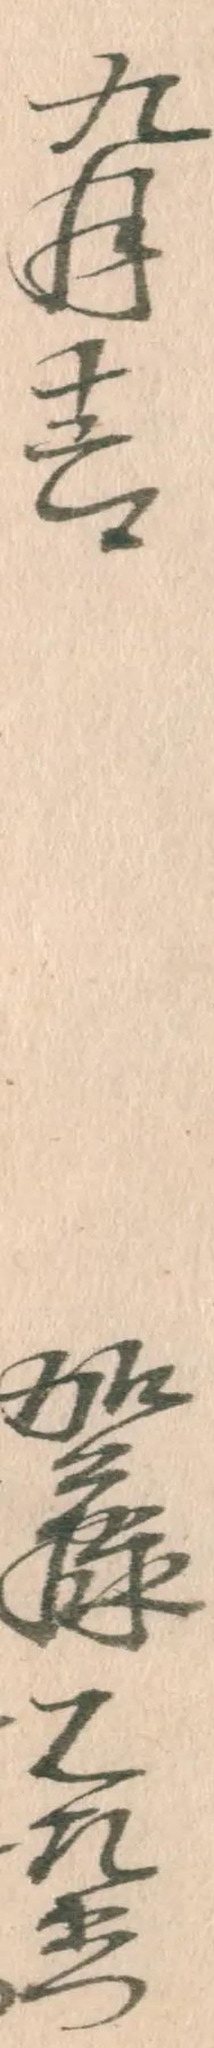九月十六日加藤又左衛門
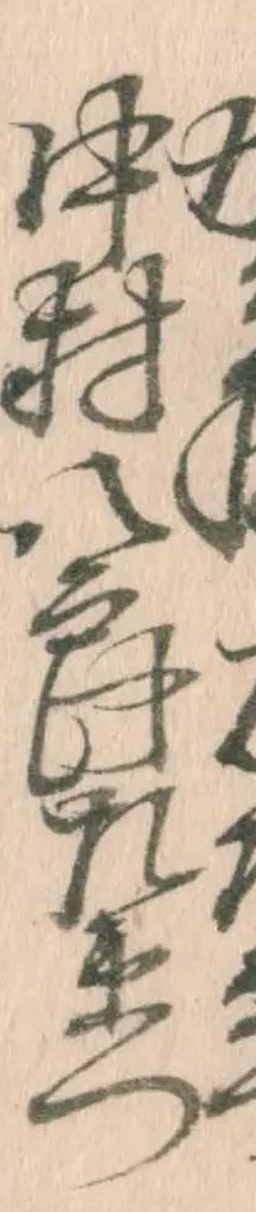中村八郎左衛門

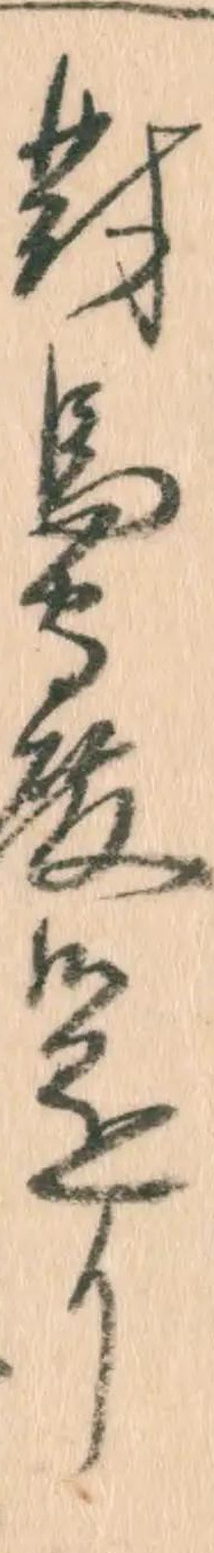│対馬守殿御懸り
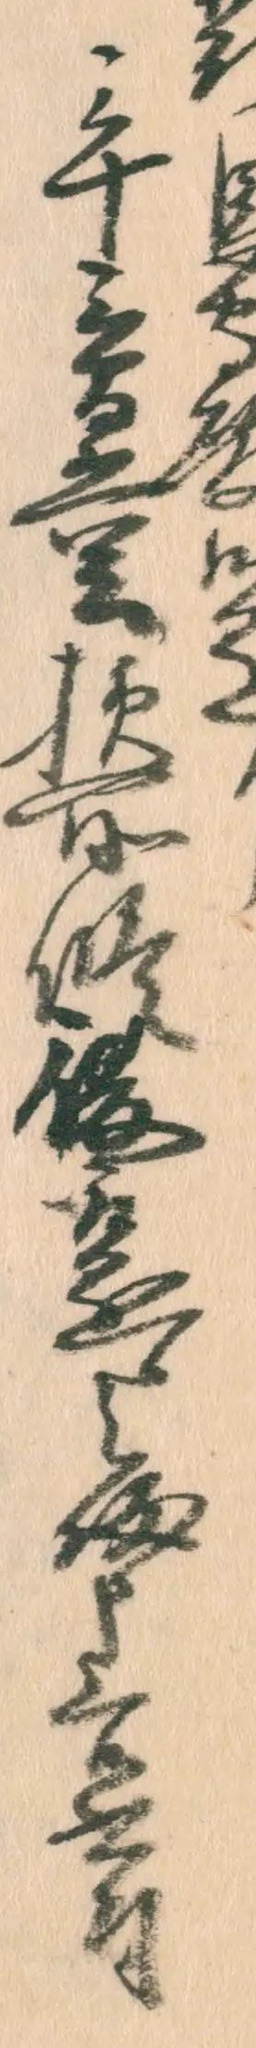│三十三間堂損所修復取懸り之儀申上候書付
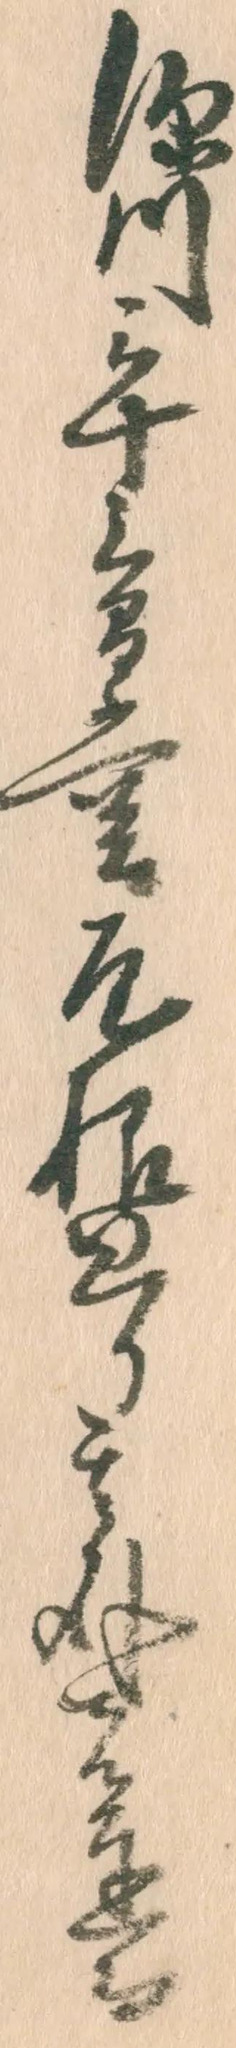深川三十三間堂屋根廻り其外先達而
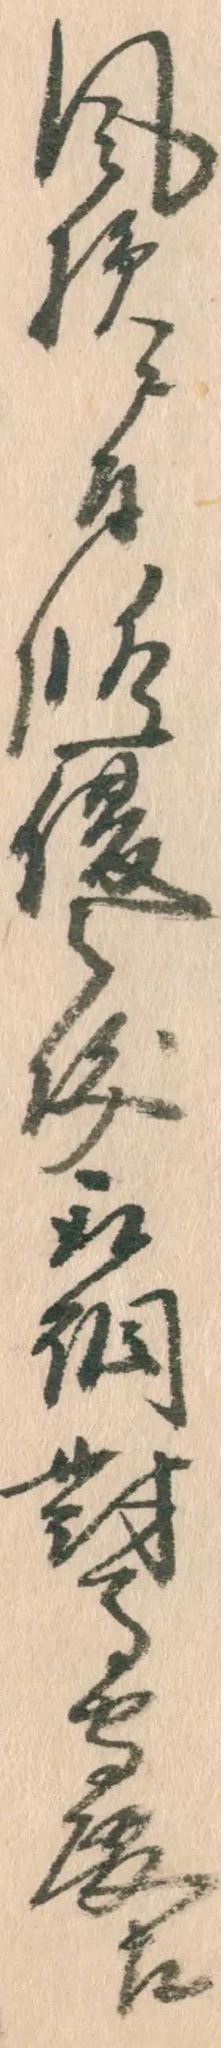風損に付修復之儀取調対馬守殿え
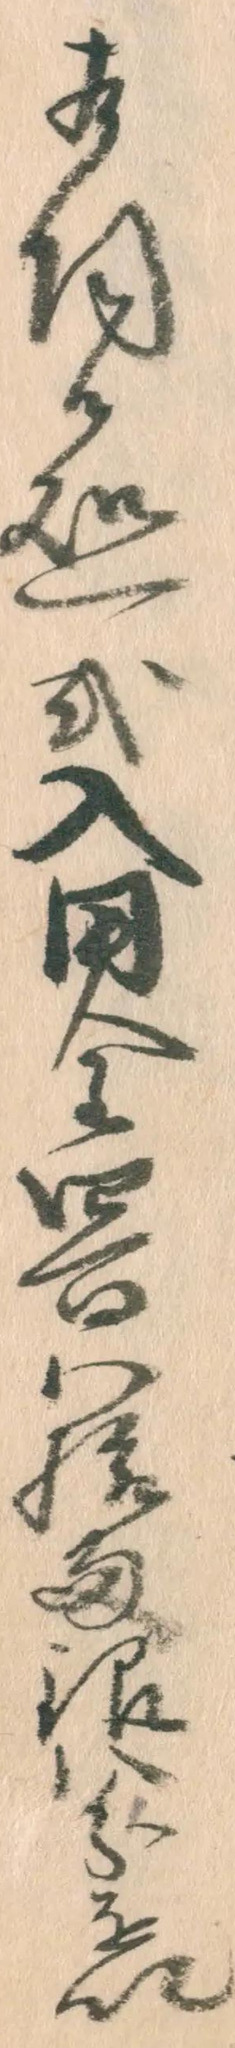相伺候処一式入用金四百八拾両銀八分を以

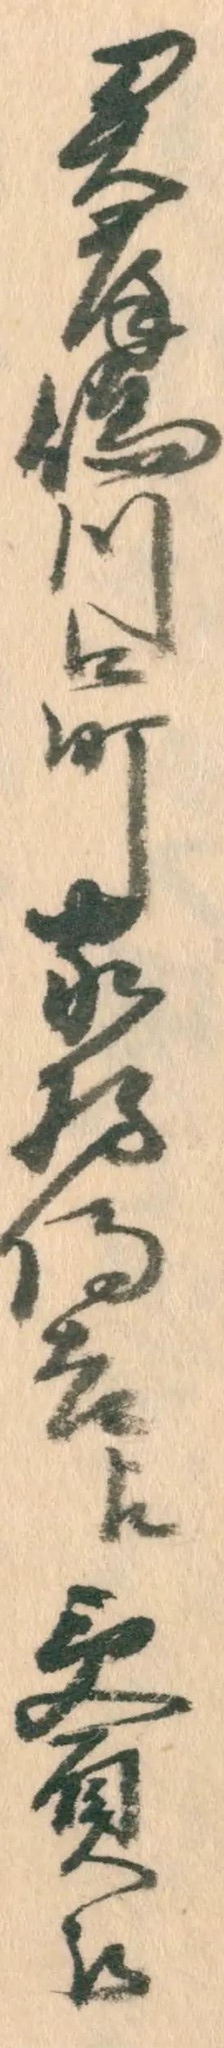霊岸嶋川口町家持伝吉え受負被
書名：三十三間堂. [1]
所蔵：国立国会図書館 National Diet Library, JAPAN
